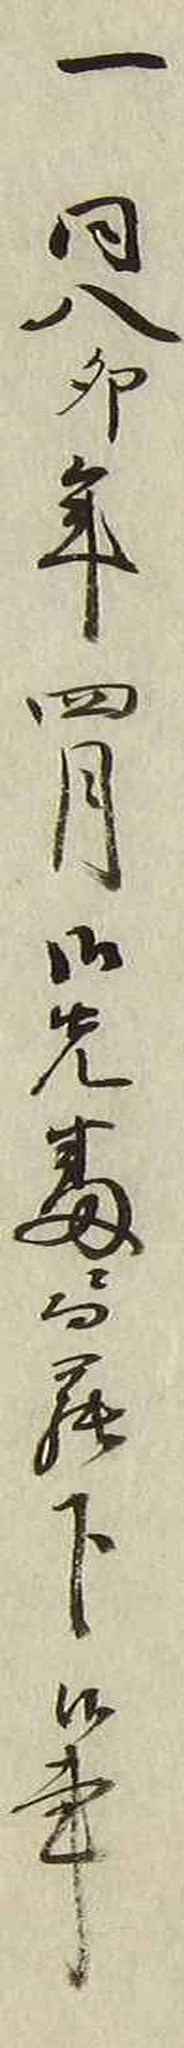一同八卯年四月御先番ニて罷り下り候事
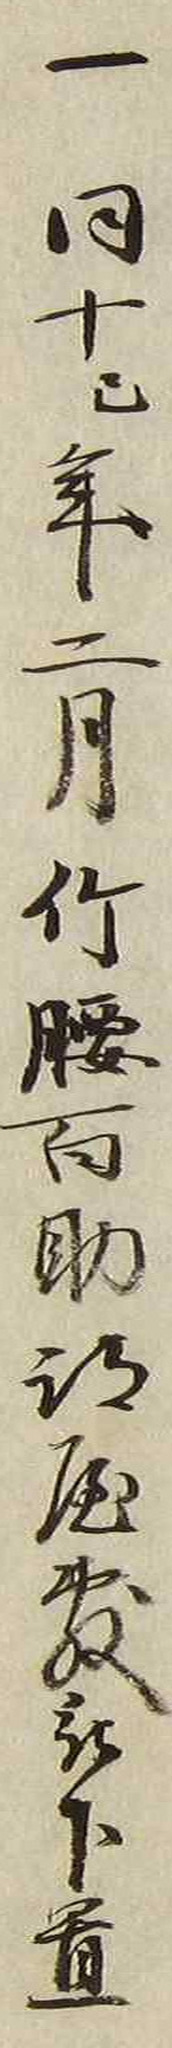一同十巳年二月竹腰百助部屋敷下し置かれ

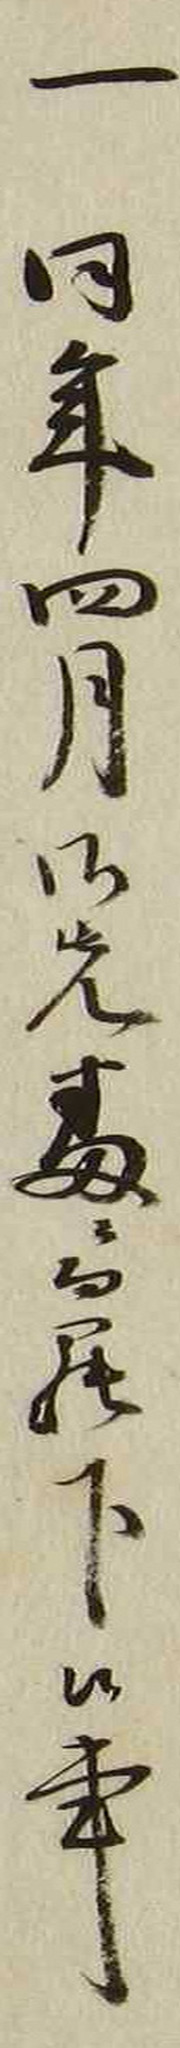一同年四月御先番ニて罷り下り候事
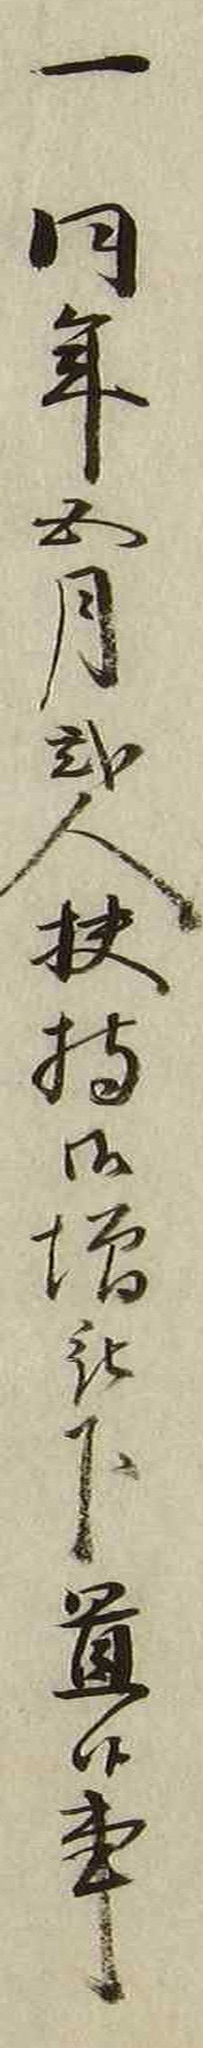一同年五月弐人扶持御増下し置かれ候事
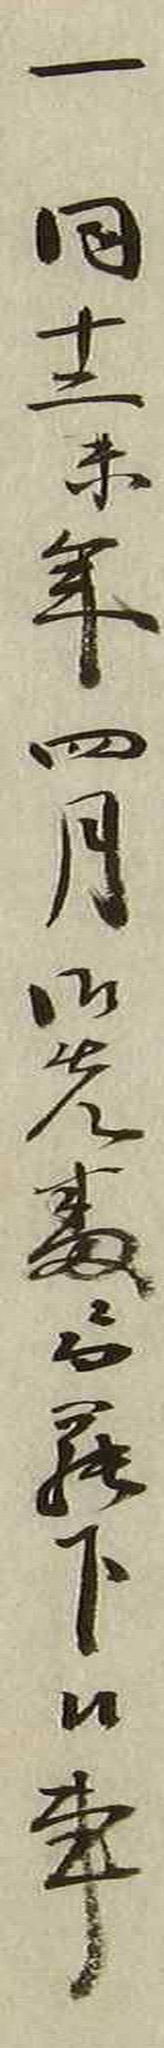一同十二未年四月御先番ニて罷り下り候事
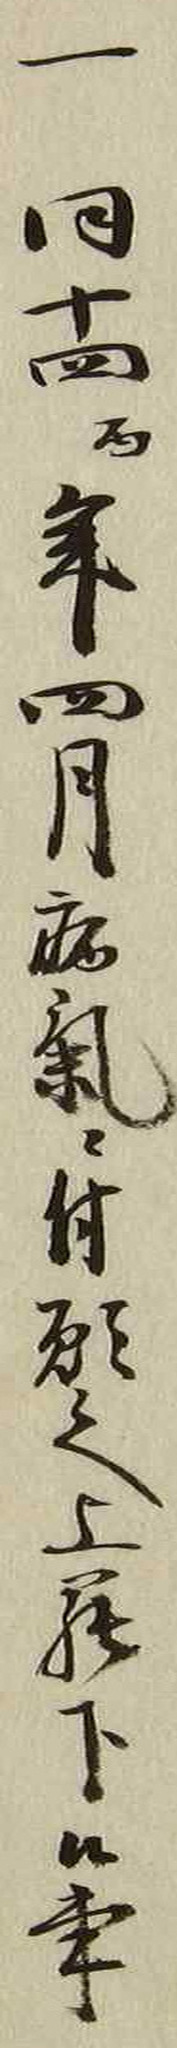一同十四酉年四月病気ニ付願之上罷り下り候事
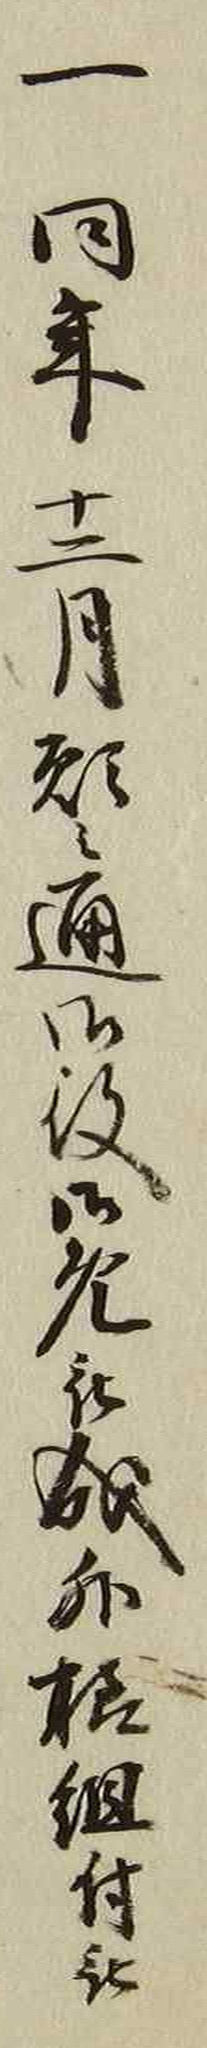一同年十二月願之通り御役御免成られ外様組付
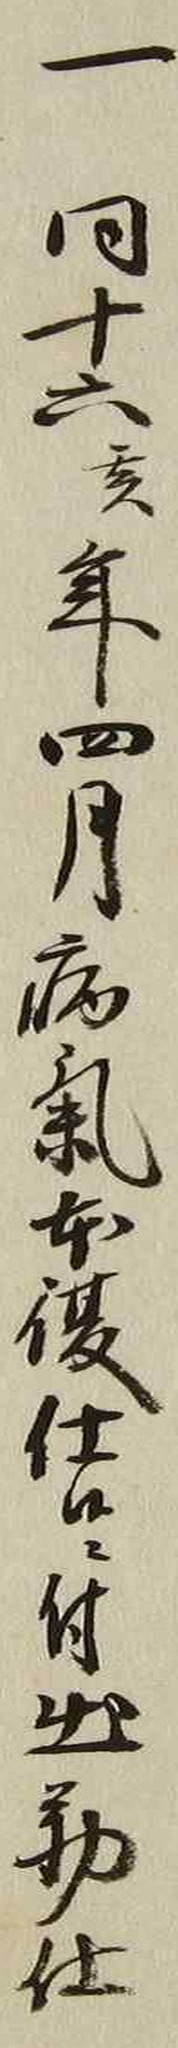一同十六亥年四月病気本復仕り候ニ付出勤仕
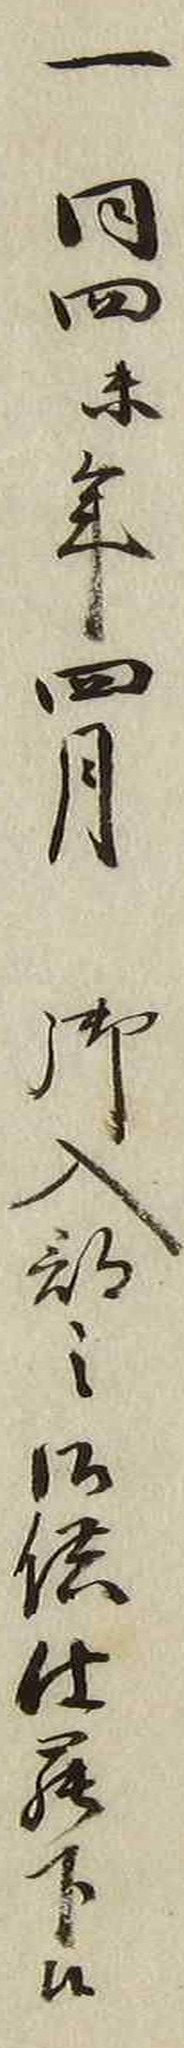一同四未年四月御入部之御供仕り罷り下り候

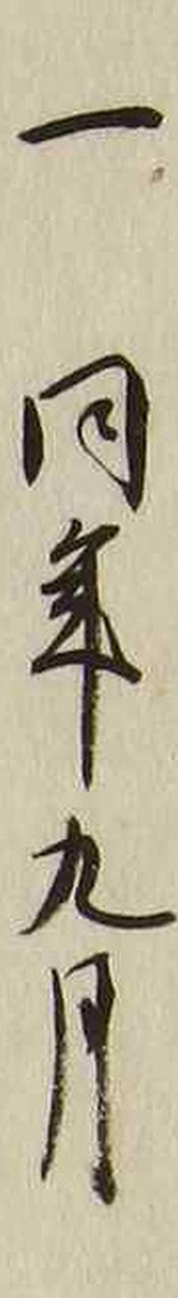一同年十月
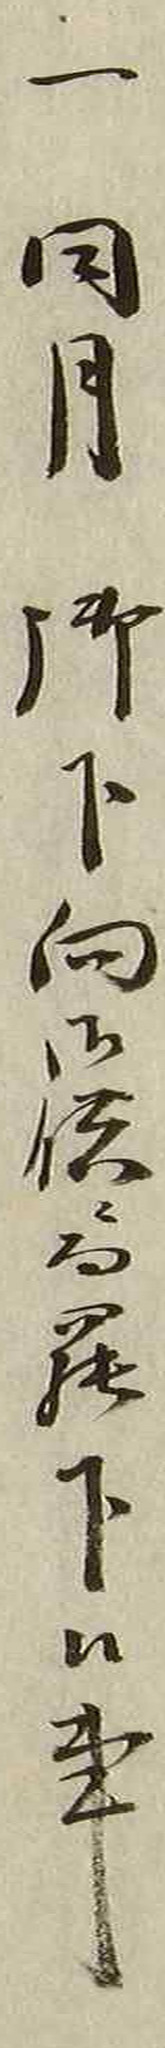一同月御下向御供ニて罷り下り候事
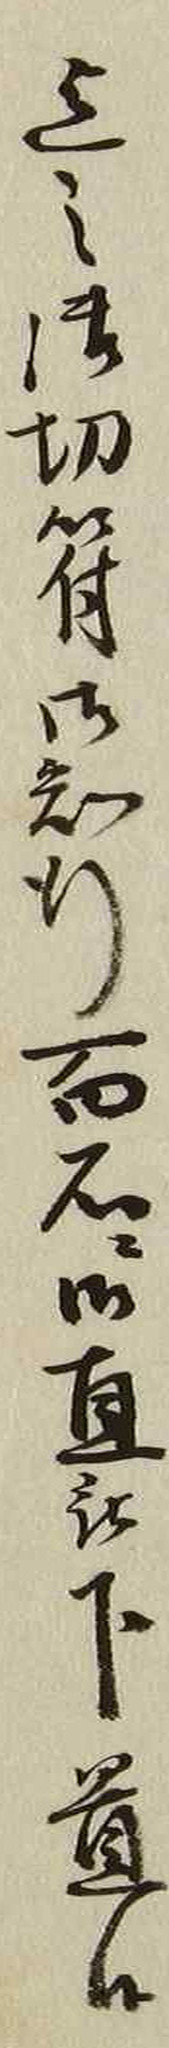迄之御切符御知行百石ニ御直下し置かれ候
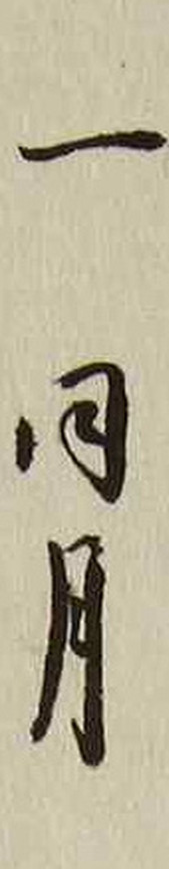一同月
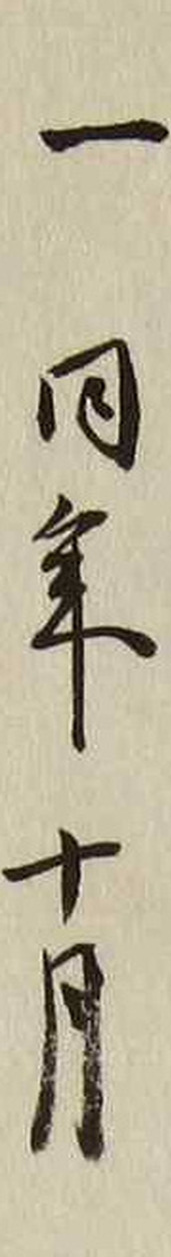一同年十月
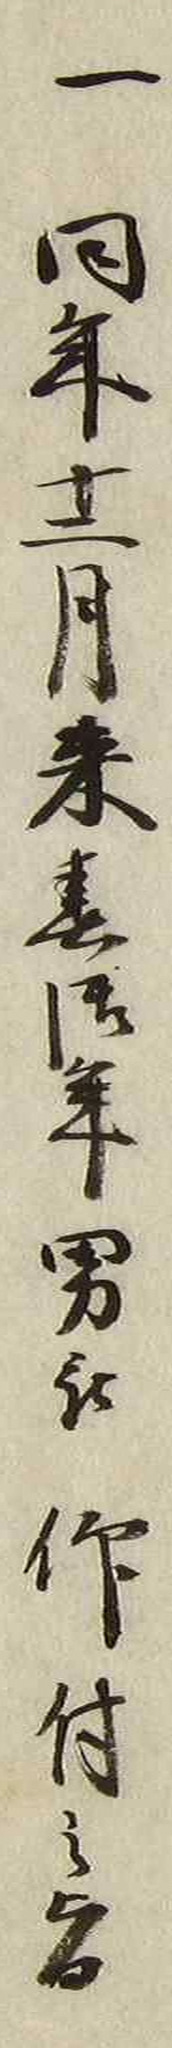一同年十二月来春御年男仰せ付けられ候旨

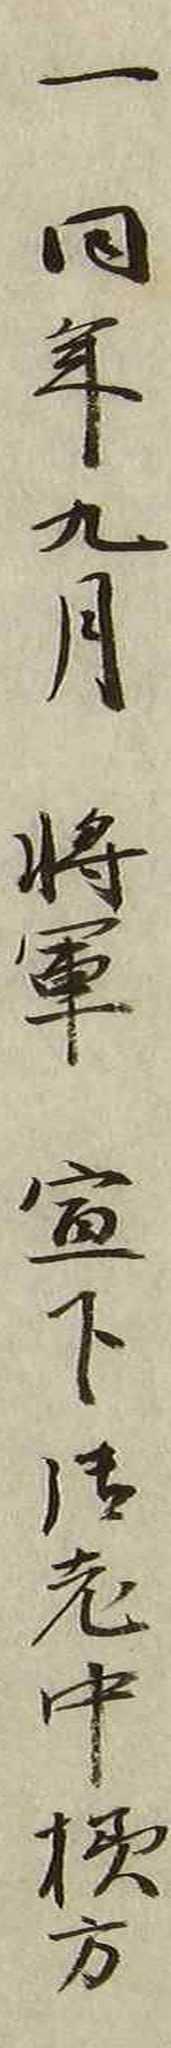一同年九月将軍宣下御老中様方
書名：諸士系譜　巻之19　い之部19
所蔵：会津若松市立会津図書館
